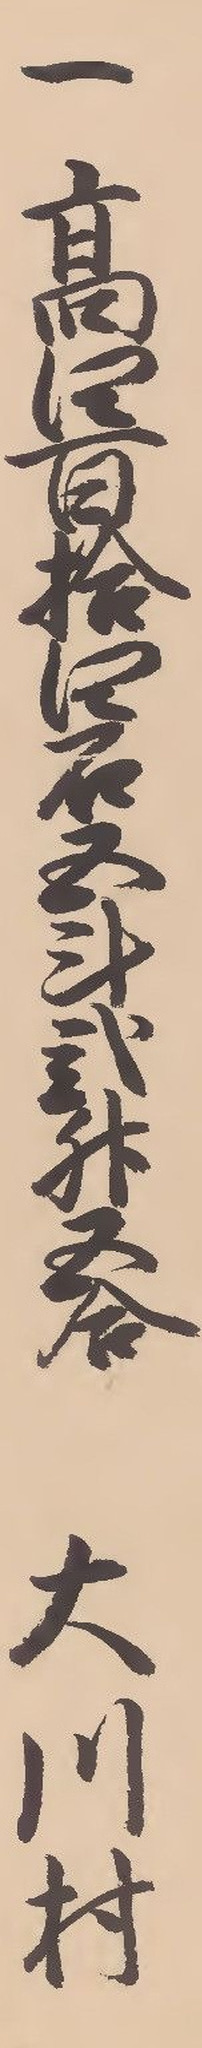一高四百拾四石五斗弐升五合大川村
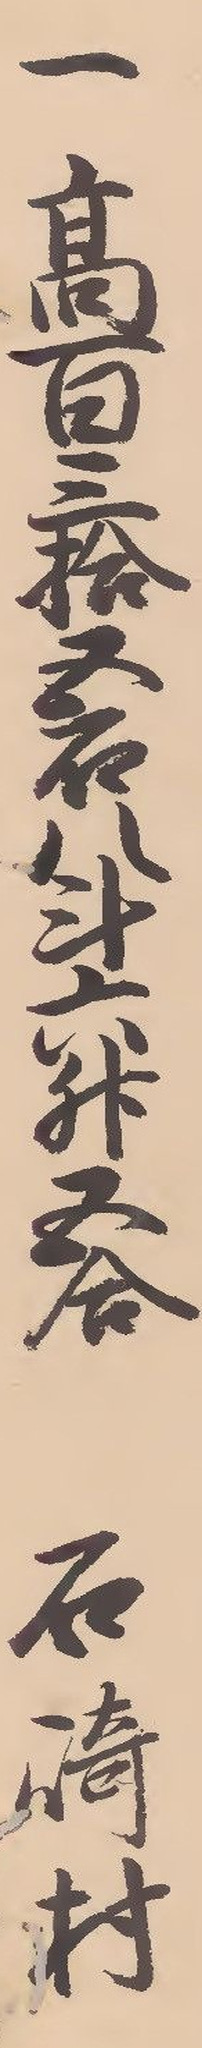一高百三拾五石八斗六升五合石崎村

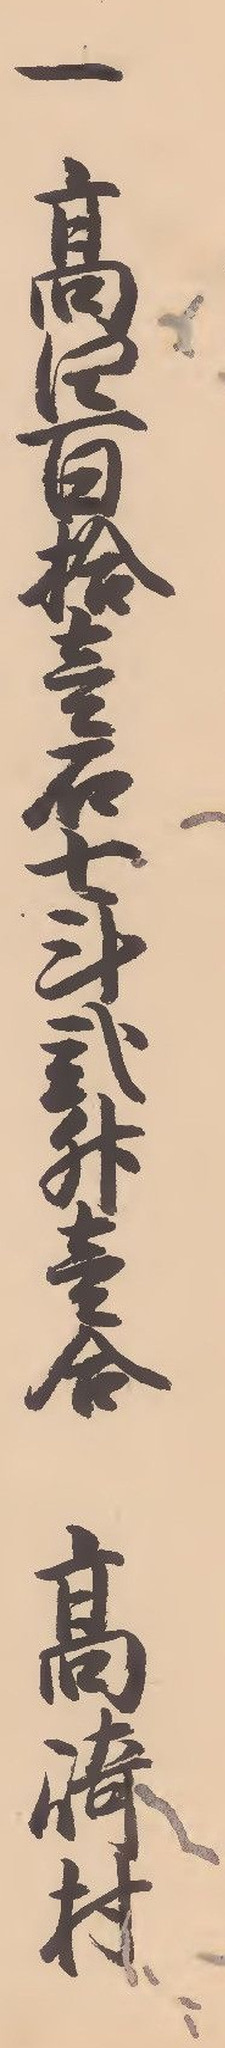一高四百拾壱石七斗弐升壱合高崎村
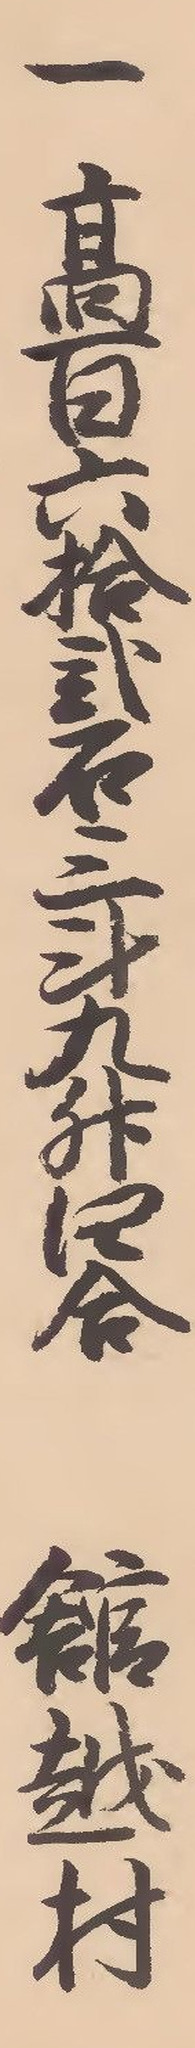一高百六拾弐石三斗九升四合館越村
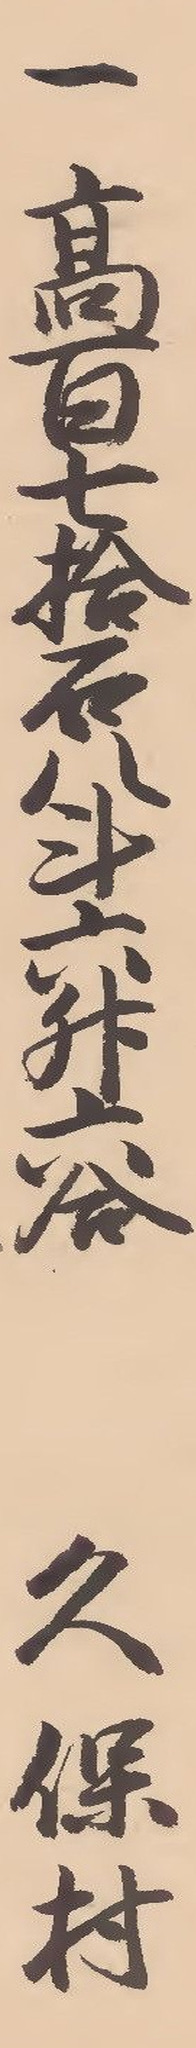一高百七拾石八斗六升六合久保村
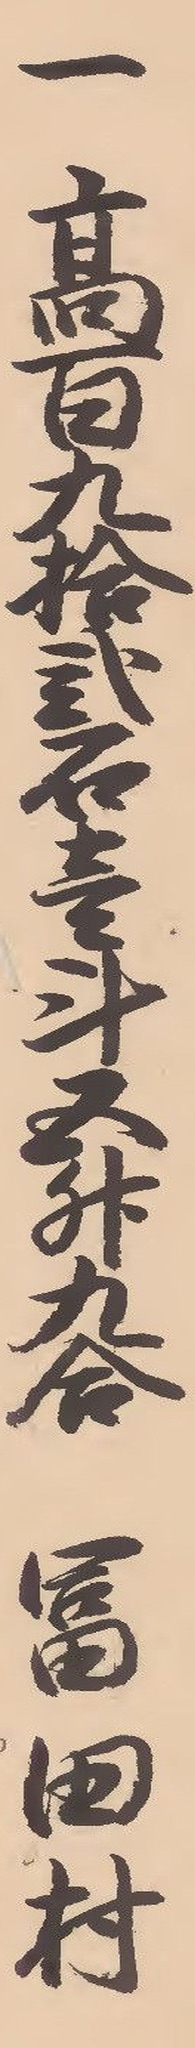一高百九拾弐石壱斗五升九合冨田村
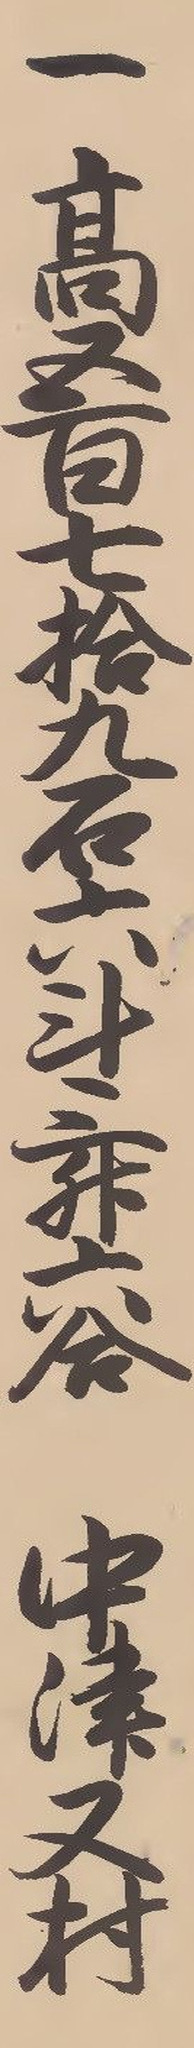一高五百七拾九石六斗三升六合中津又村
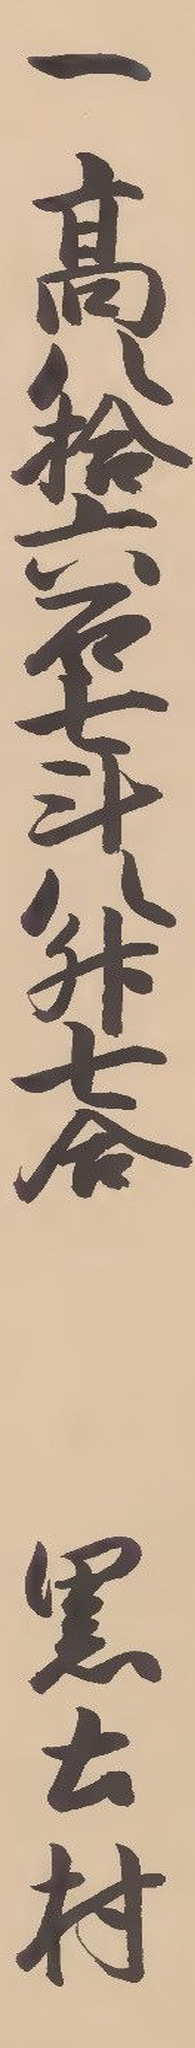一高八拾六石七斗八升七合黒土村
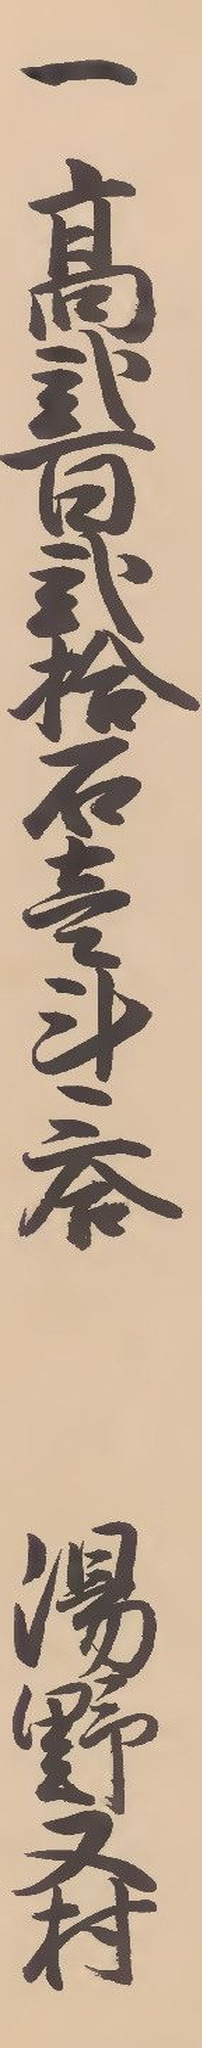一高弐百弐拾石壱斗三合湯野又村
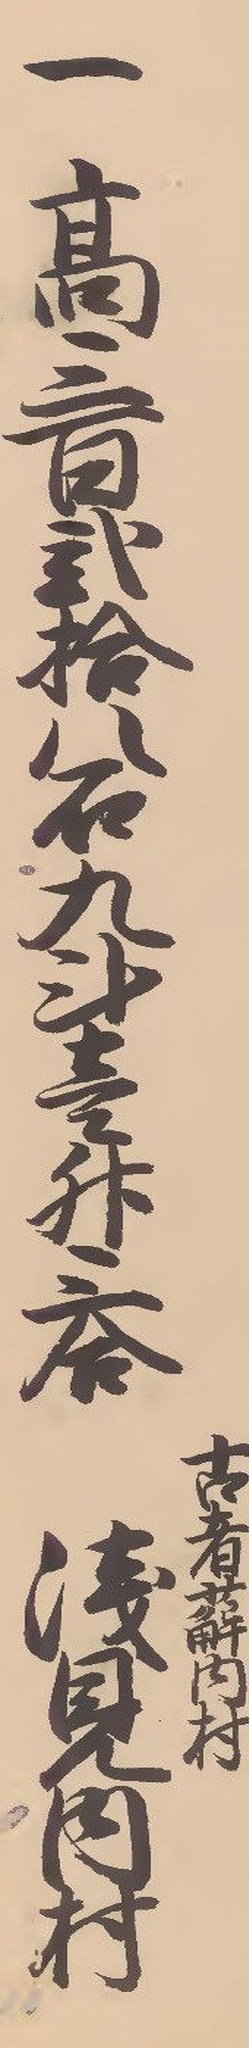一高三百弐拾八石九斗壱升三合浅見内村

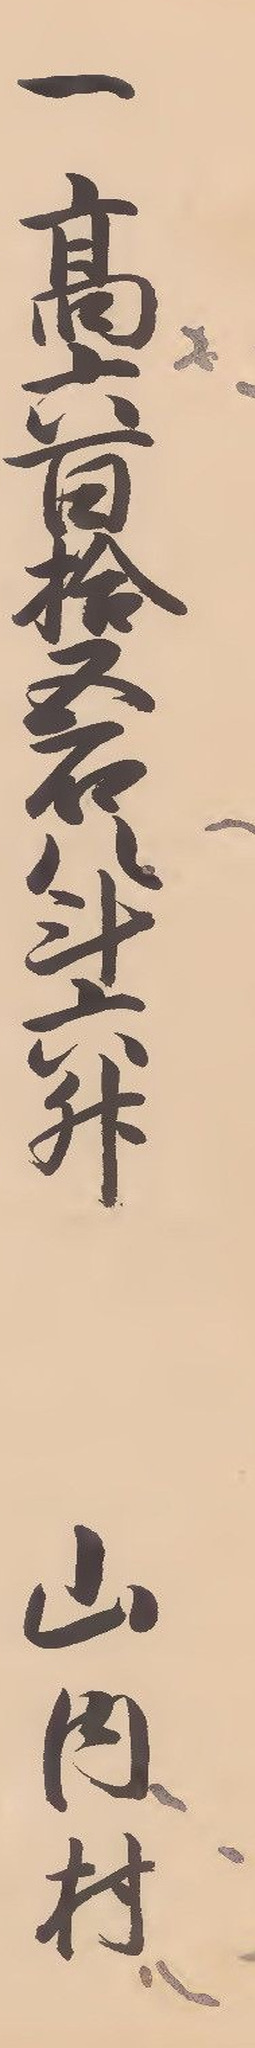一高六百拾五石八斗六升山内村
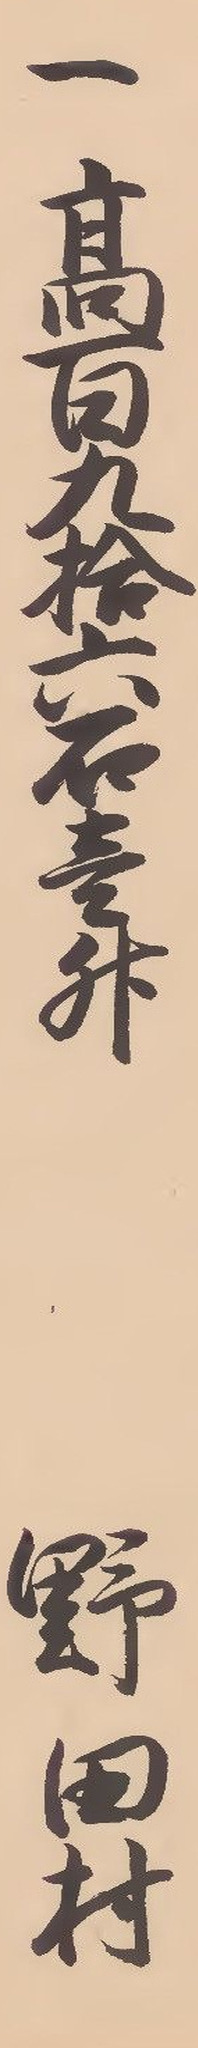一高百九拾六石壱升野田村
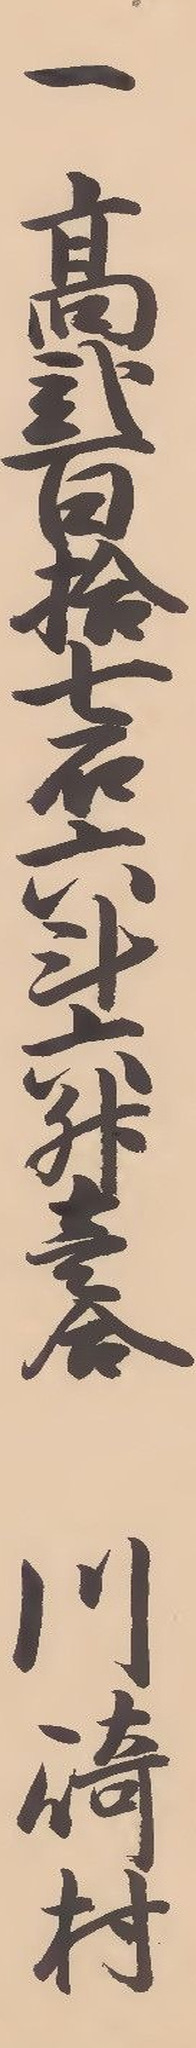一高弐百拾七石六斗六升壱合川崎村
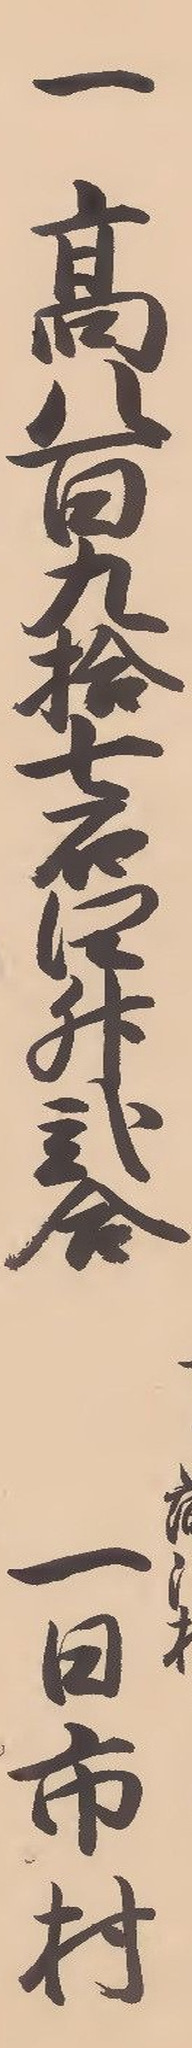一高八百九拾七石四升弐合一日市村
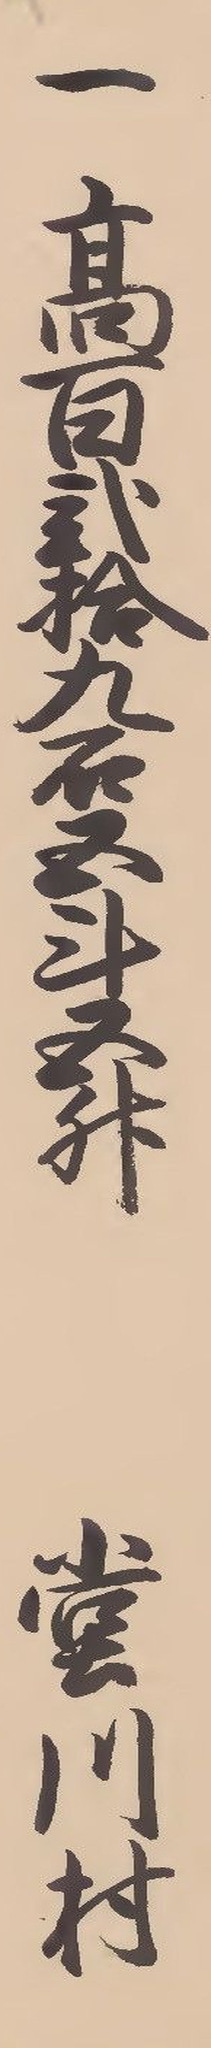一高百弐拾九石五斗五升堂川村
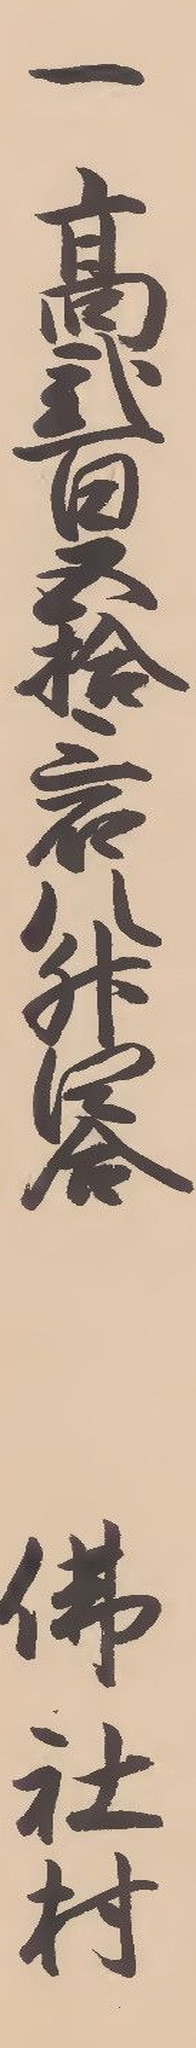一高弐百五拾三石八升四合仏社村
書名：出羽国郷帳　５
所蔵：国立公文書館 National Archives of Japan
